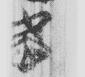㤅
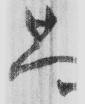也
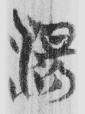湯
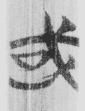或
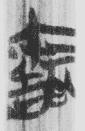{尒䎽}
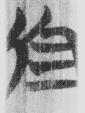於
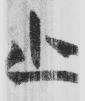少
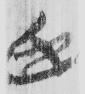臣
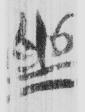爲
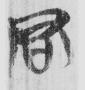君
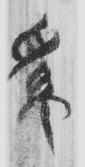奚
